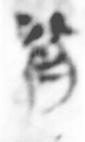紫
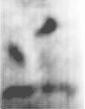之
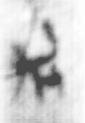加（勒）
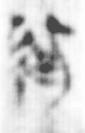紫
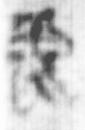因（絪）
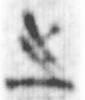之
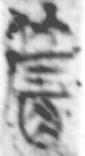○（席）
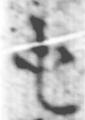屯
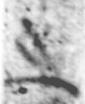之
